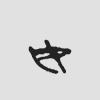女
